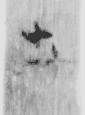{十七}
